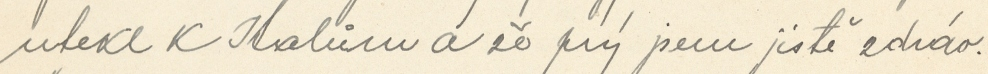utekl k Italům a že prý jsem jistě zdráv.
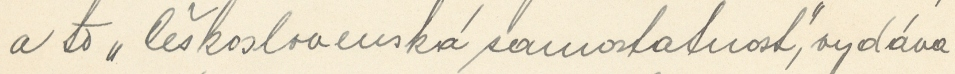a to „Československá samostatnost“ vydáva-
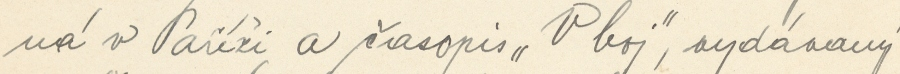ná v Paříži a časopis „V boj“, vydávaný
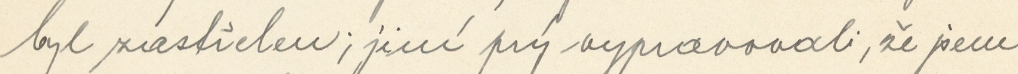byl zastřelen; jiní prý vypravovali, že jsem
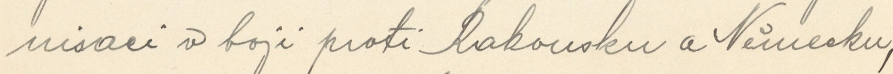nisaci v boji proti Rakousku a Německu,
